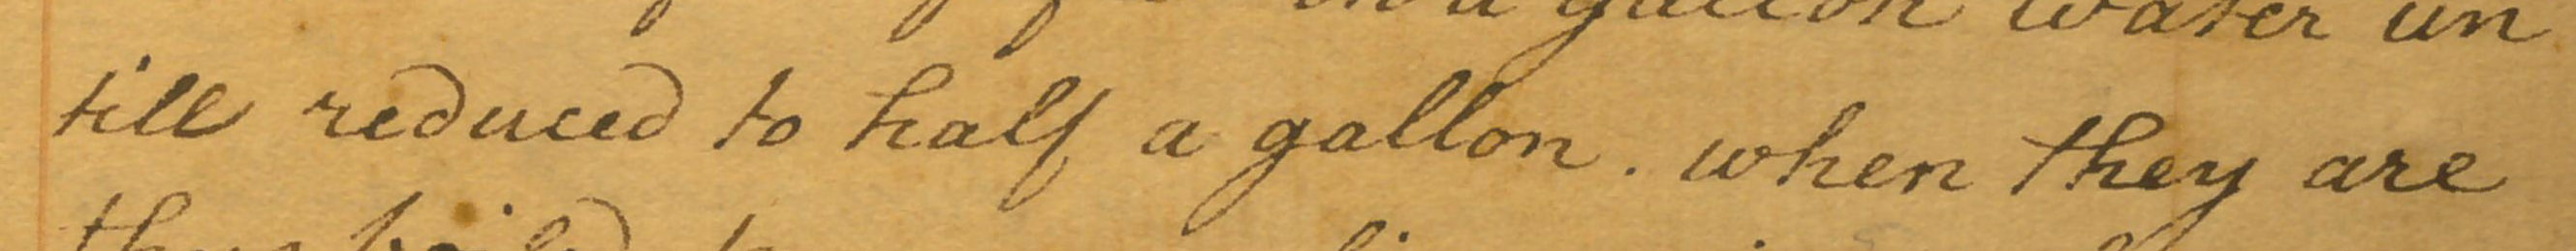till reduced to half a gallon. when they are
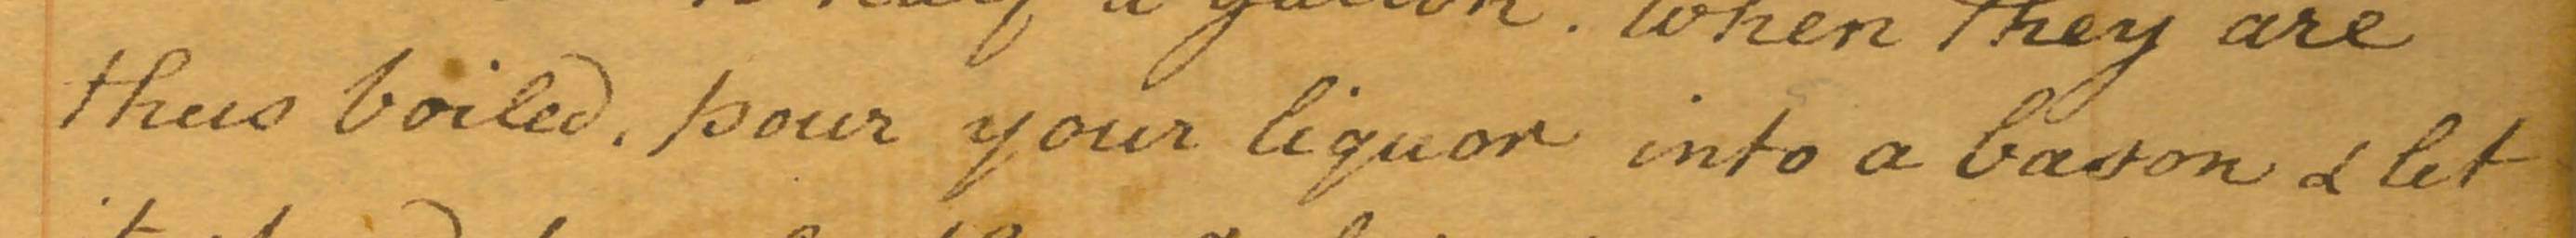thus boiled, pour your liquor into a bason & let
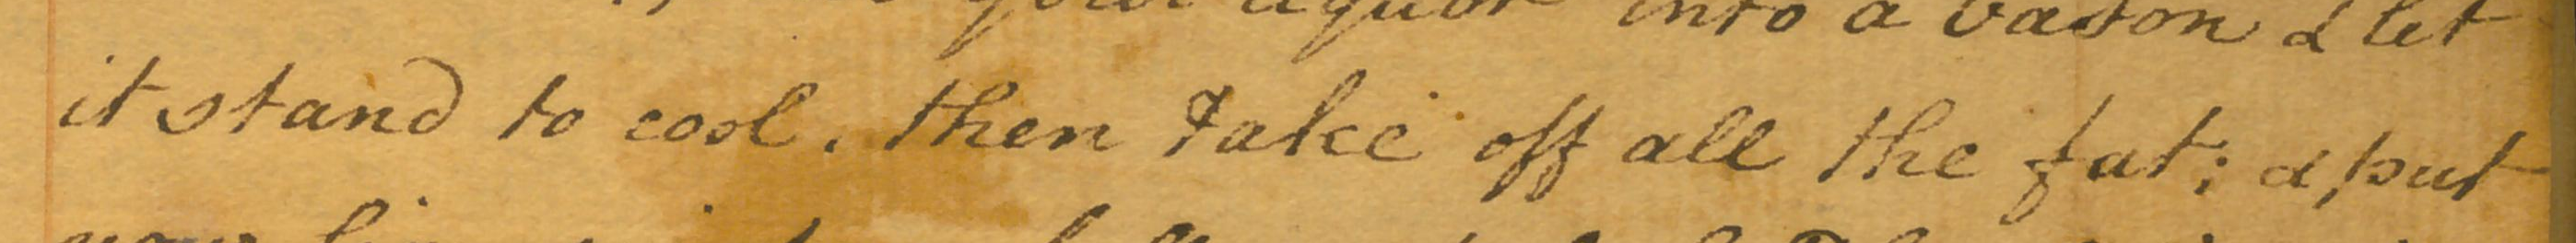it stand to cool. then take off all the fat; & put
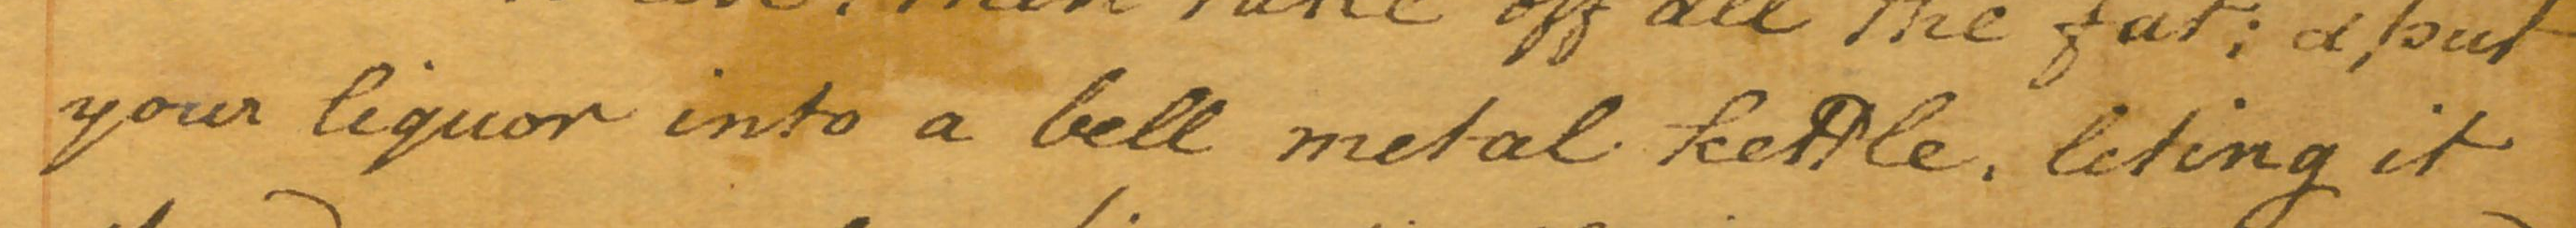your liquor into a bell metal kettle, leting it
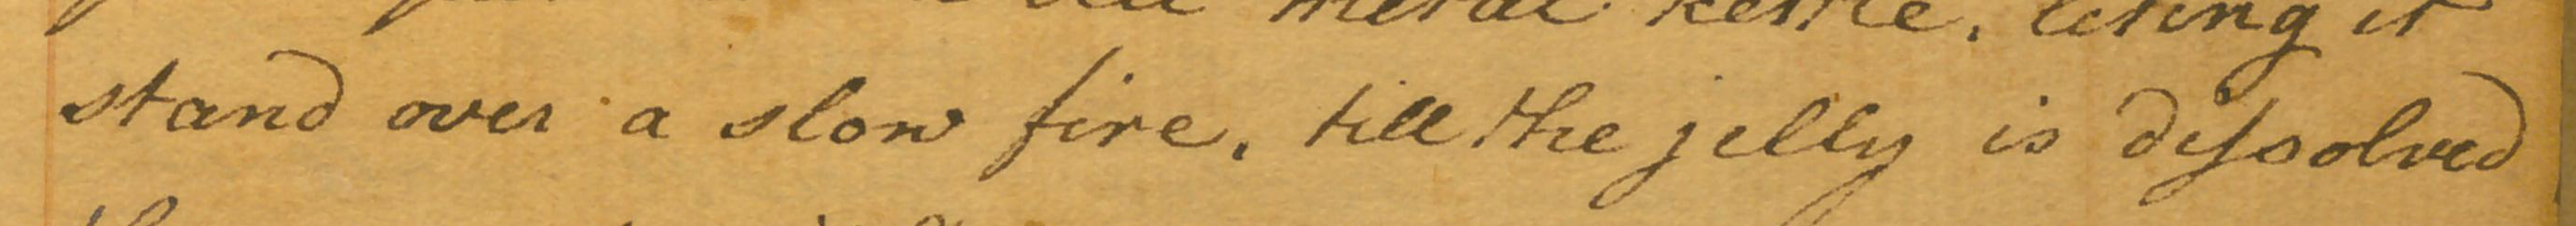stand over a slow fire, till the jelly is dissolved
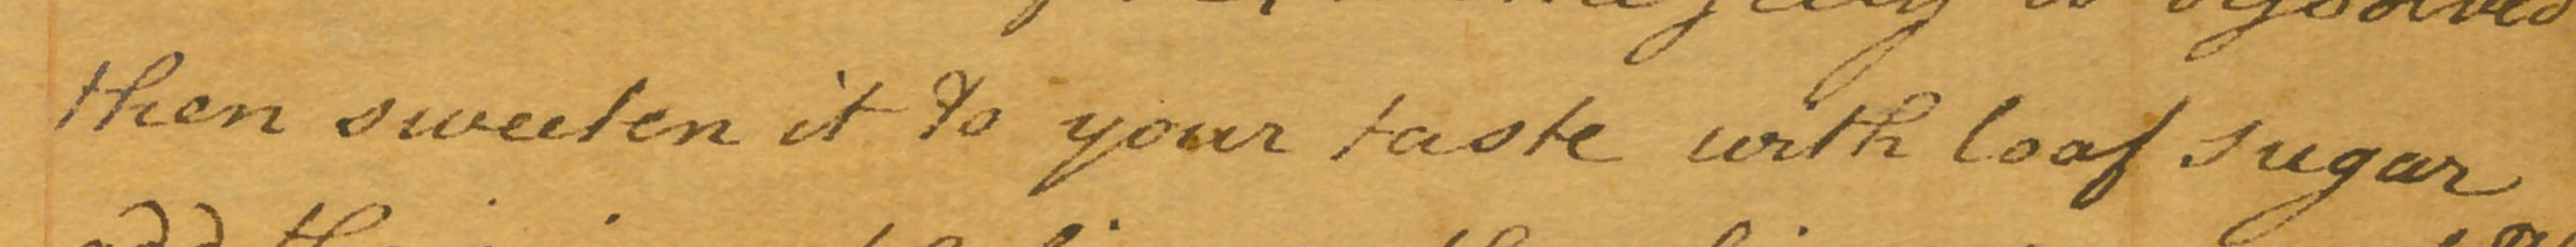then sweeten it to your taste with loaf sugar
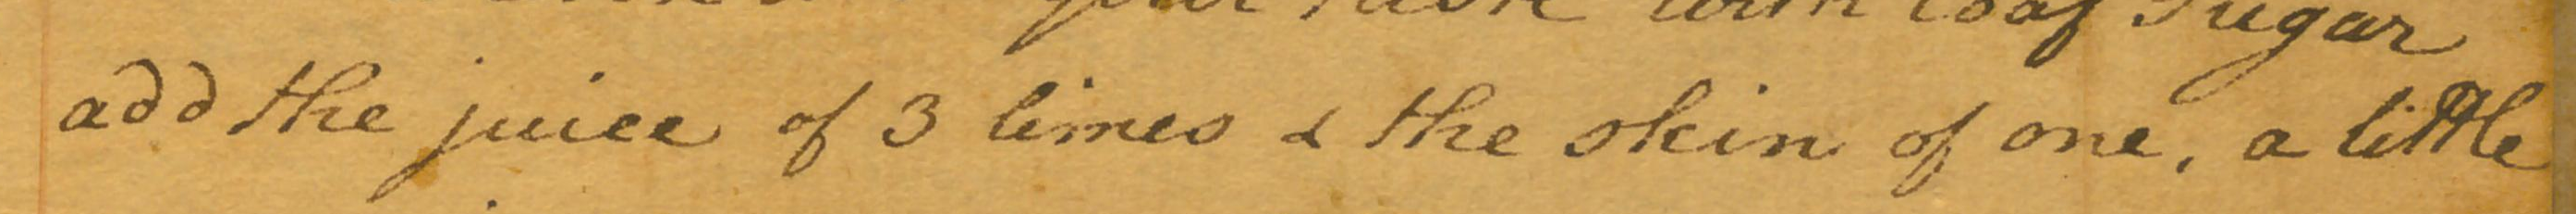add the juice of 3 limes & the skin of one, a little
